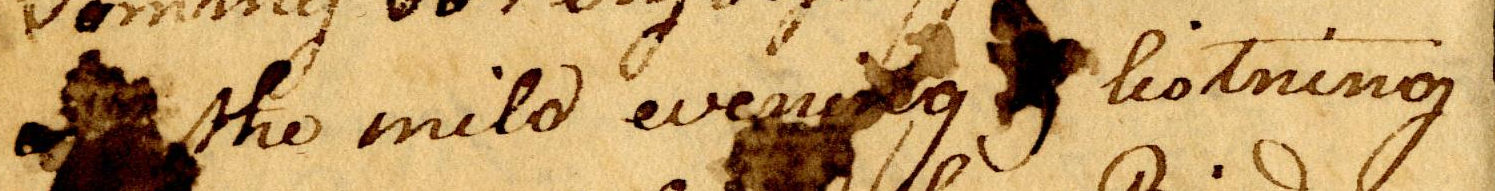of the mild evening & listning
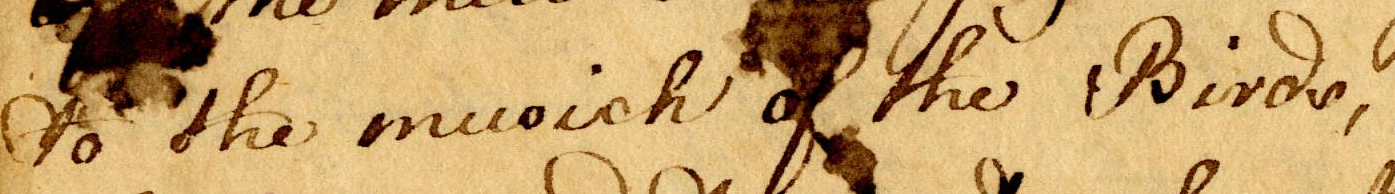to the musich of the Birds,
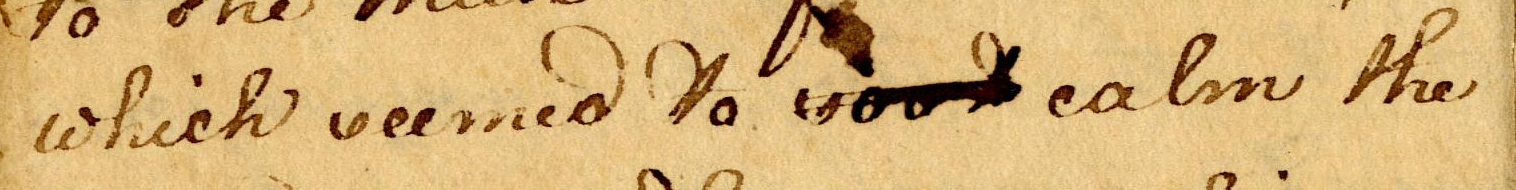which seemed to [soak] calm the
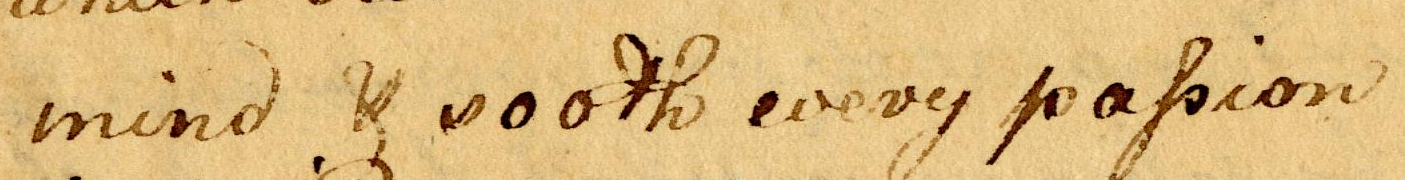mind & sooth every passion
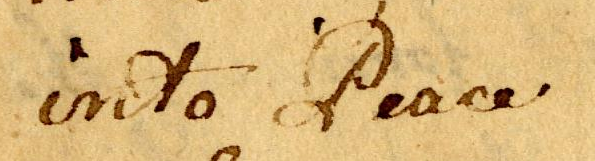into Peace
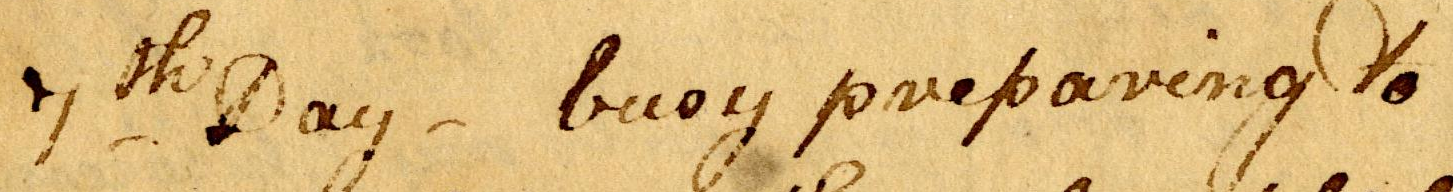7^th Day- busy preparing to
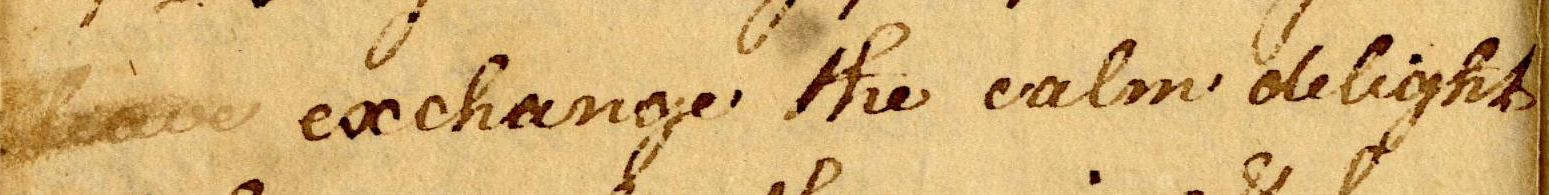have exchange the calm delight
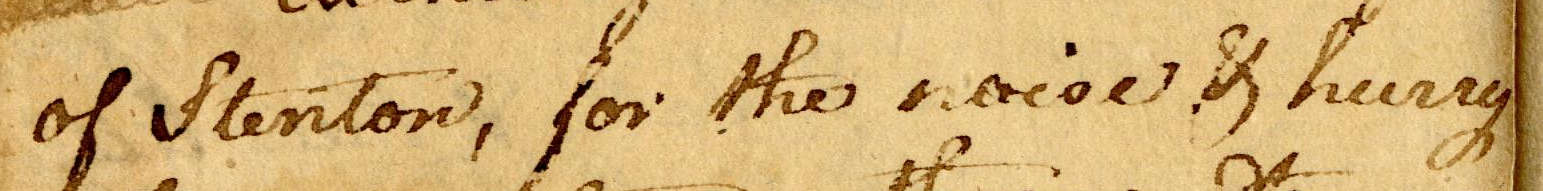of Stenton, for the noise & hurry
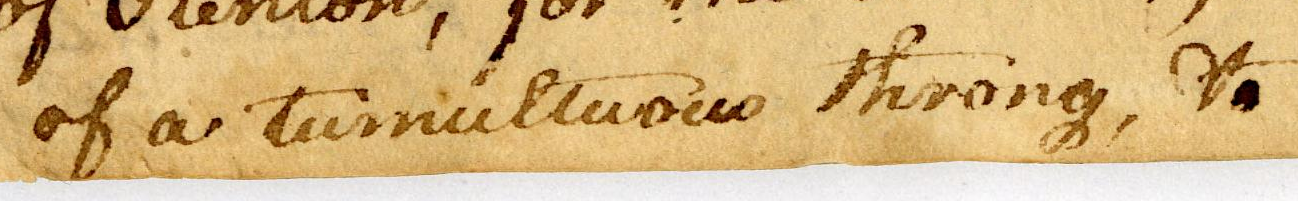of a tumultuous throng, to
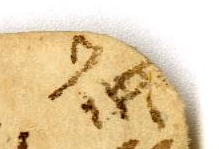75
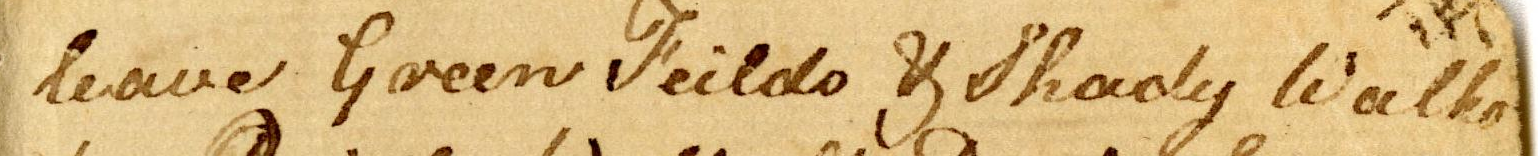leave Green Feilds & Shady Walks
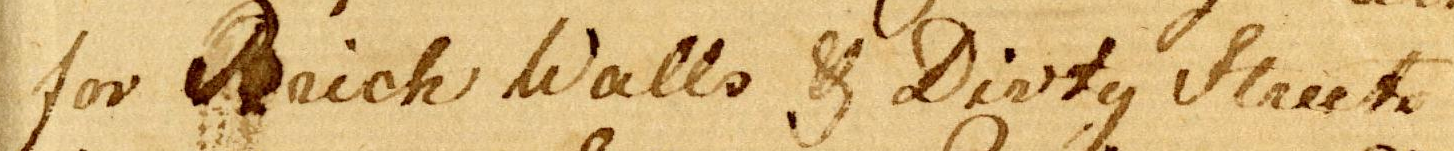for Brick Walls & Dirty Streets
